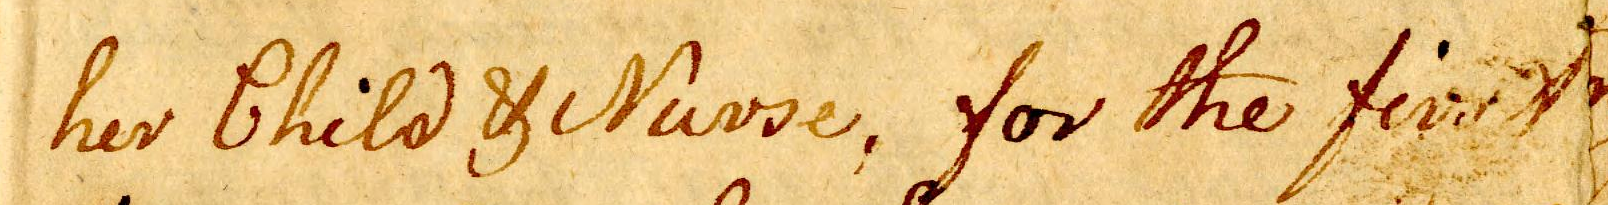her Child & Nurse, for the fir[st]
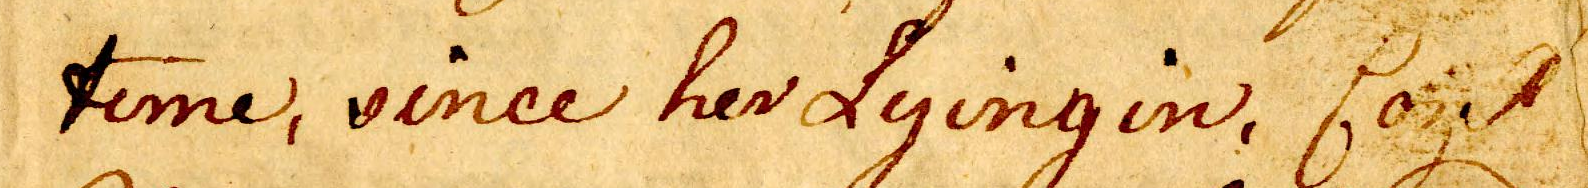time, since her Lying in, Coz
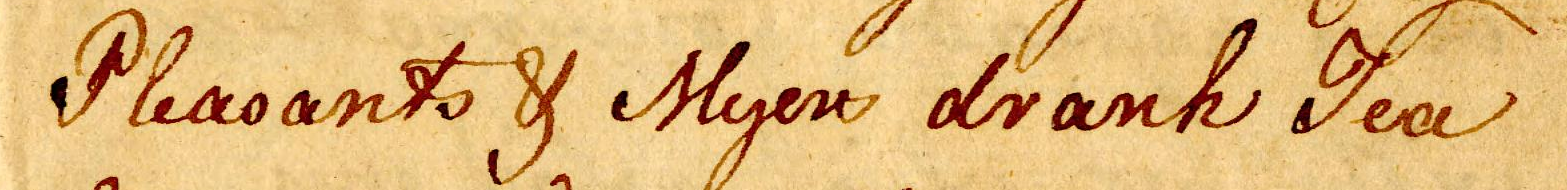Pleasants & Myers drank Tea
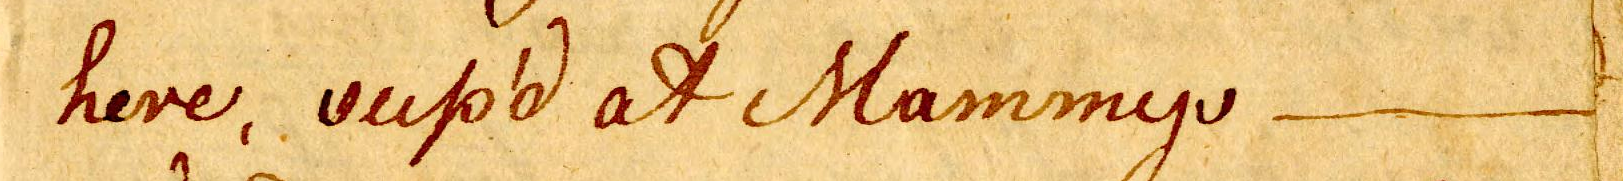here, sup'd at Mammys -
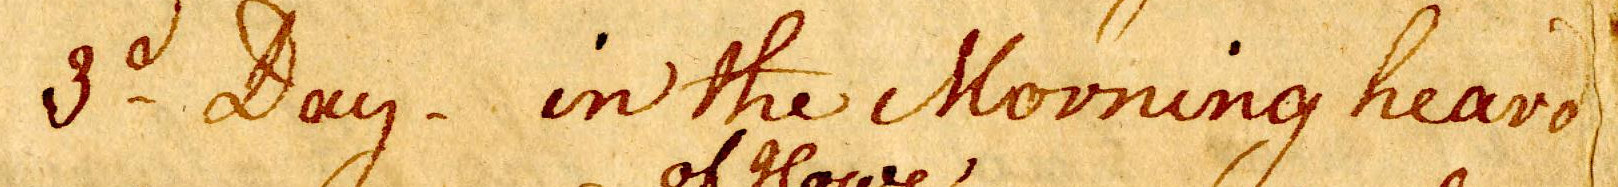3^d Day. in the Morning heard
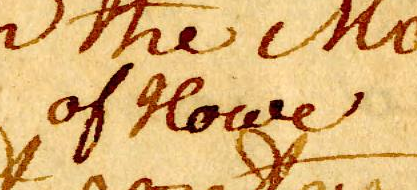of Howe
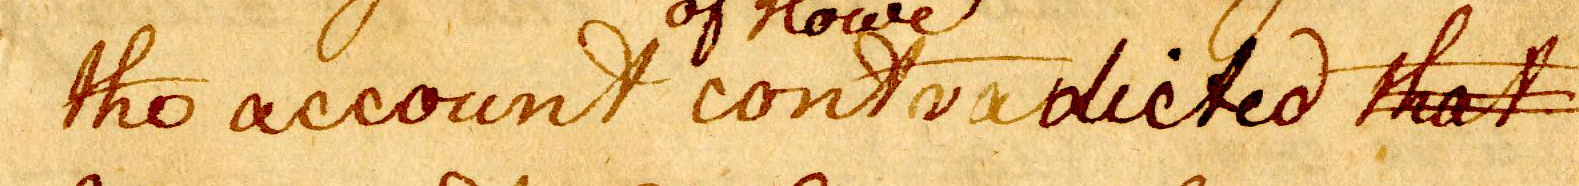the account contradicted that
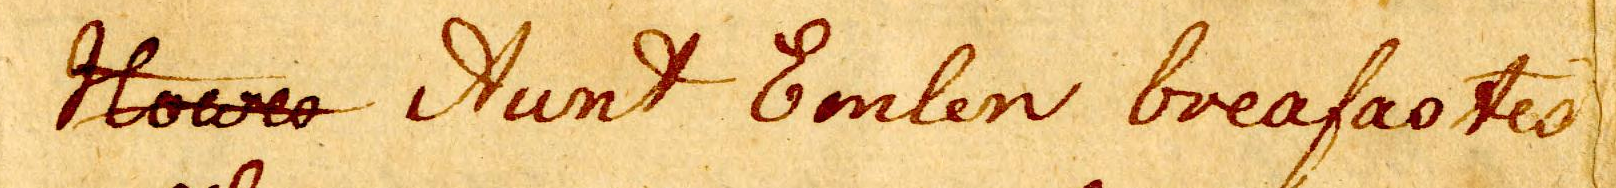Howes Aunt Emlen breafasted
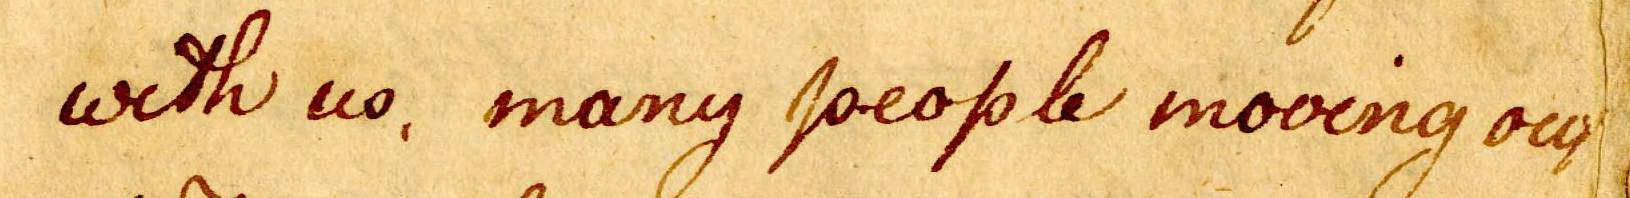with us, many people moving ou
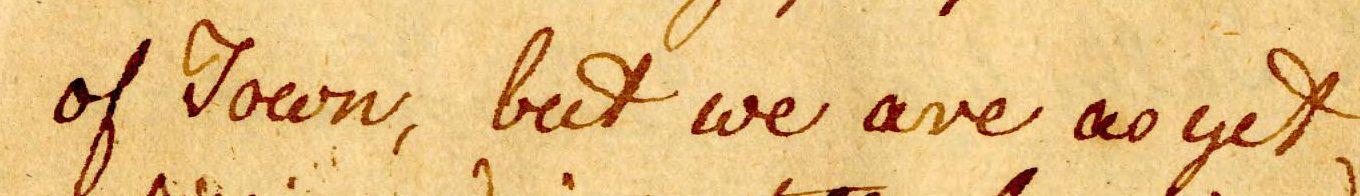of Town, but we are as yet
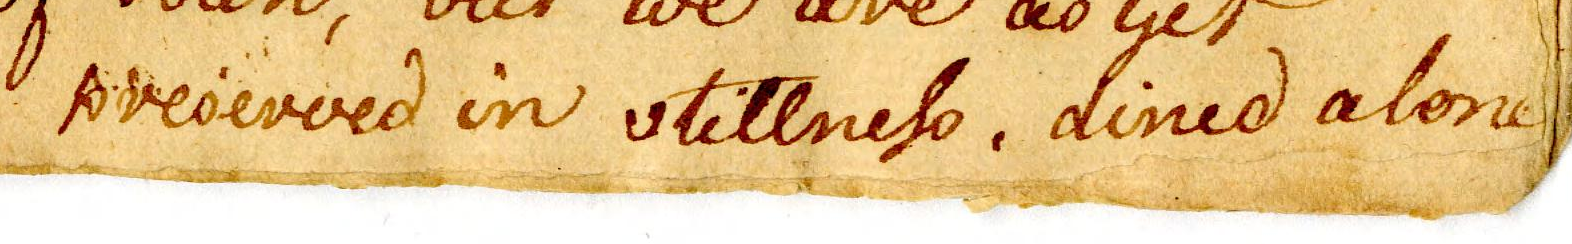preserved in stillness, dined alone
